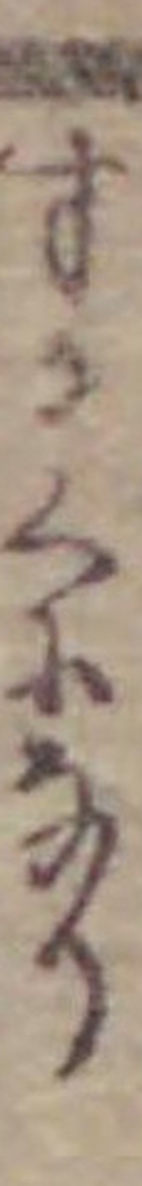するくになり
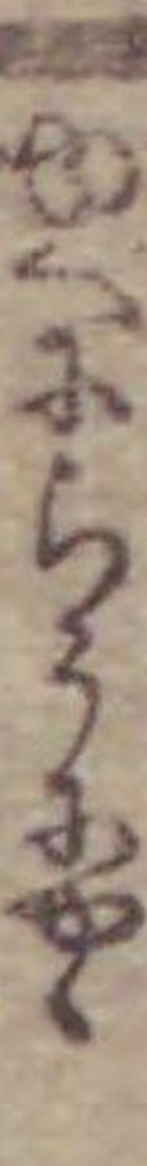ゆへにらうにやく
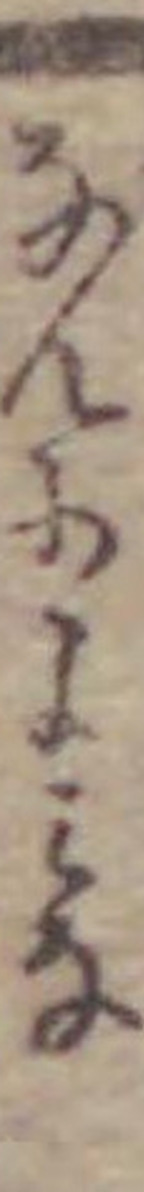なんによみな
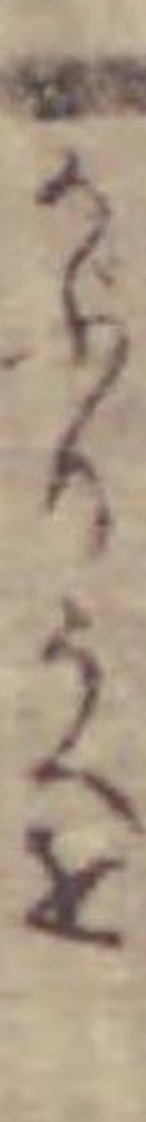かふりうへを
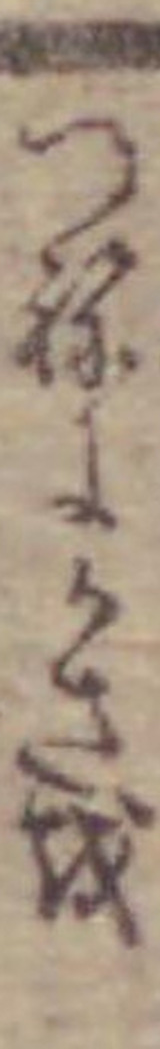つねにかさを
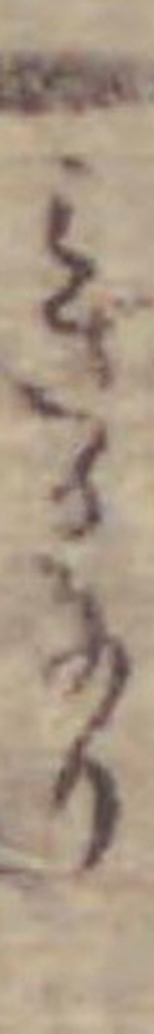みざるなり
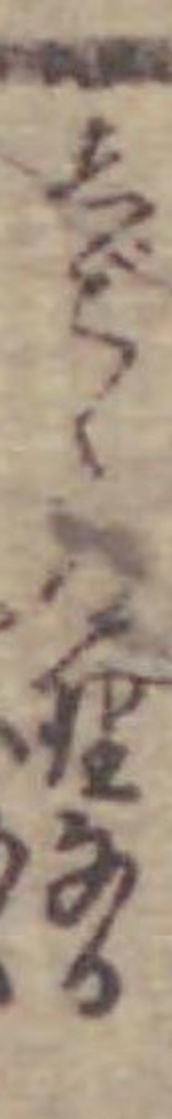しごく道理なる
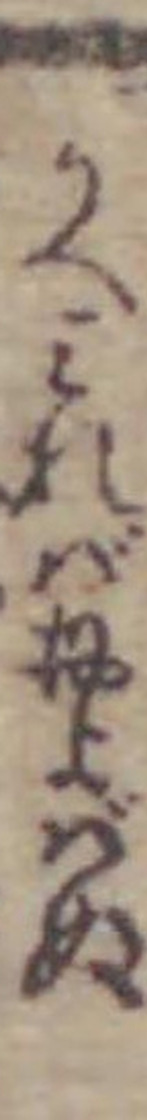〽うへみればおよばぬ
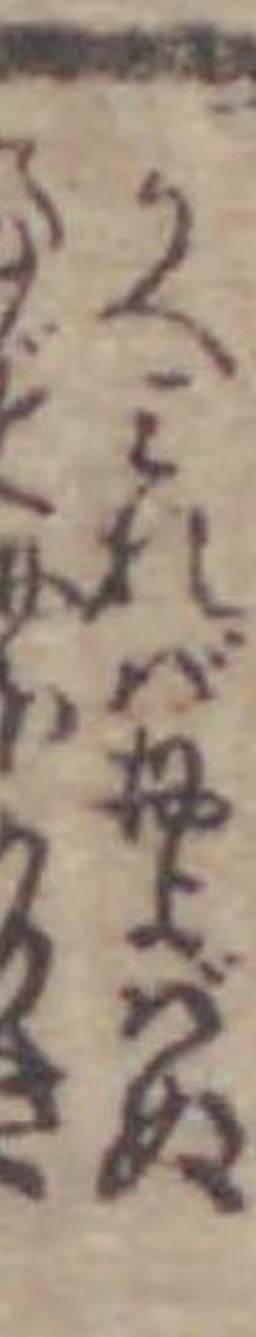事ぞおほかりき
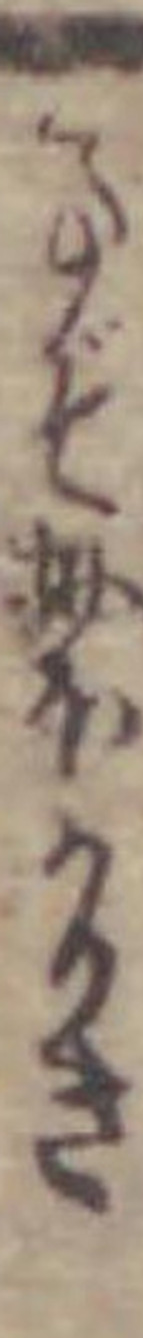事ぞおほかりき
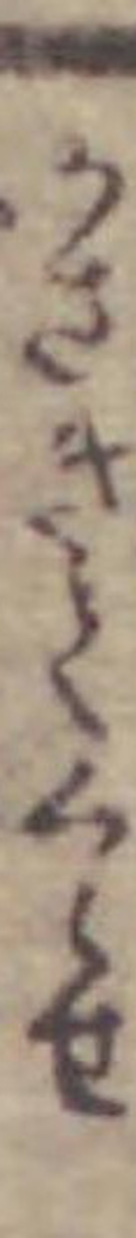かさきてくらせ
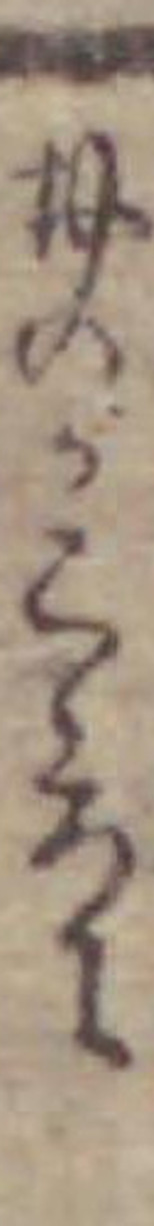おのかこゝろに
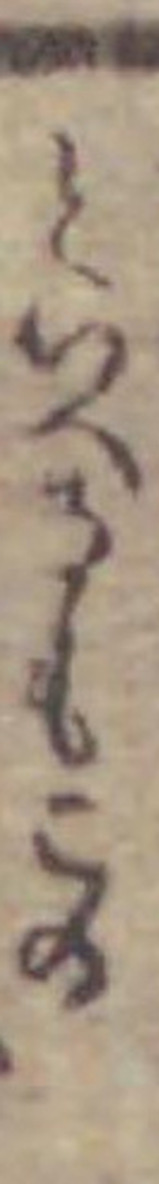といへるもこの
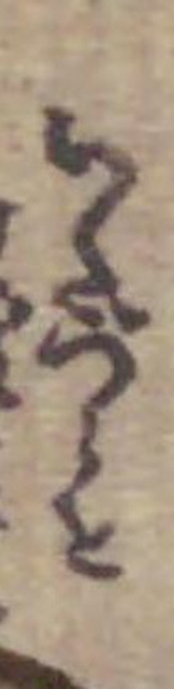いたづらを
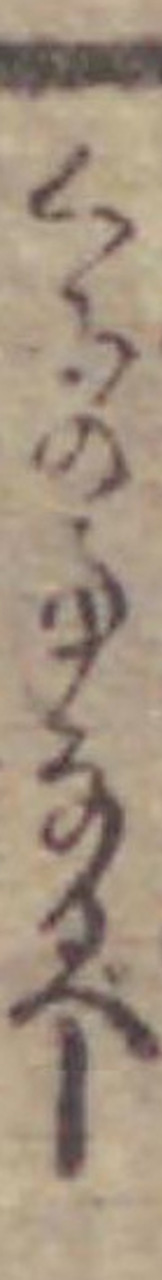くにの事なるべし
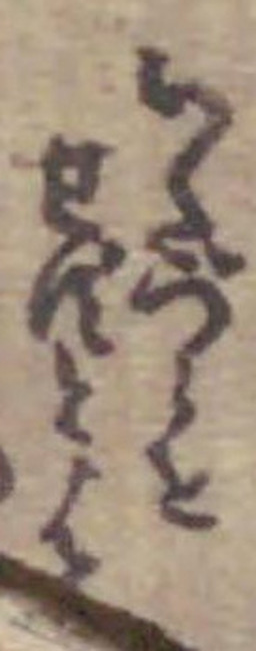せずとは
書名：和荘兵衛後日話 : 3巻
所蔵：国立国会図書館 National Diet Library, JAPAN
